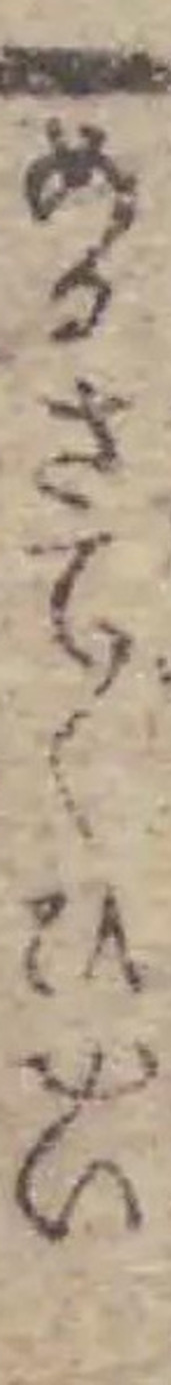めるさて〳〵ひやい
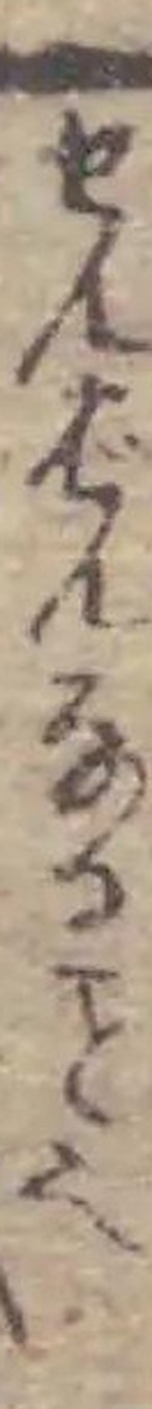せんばんなること也
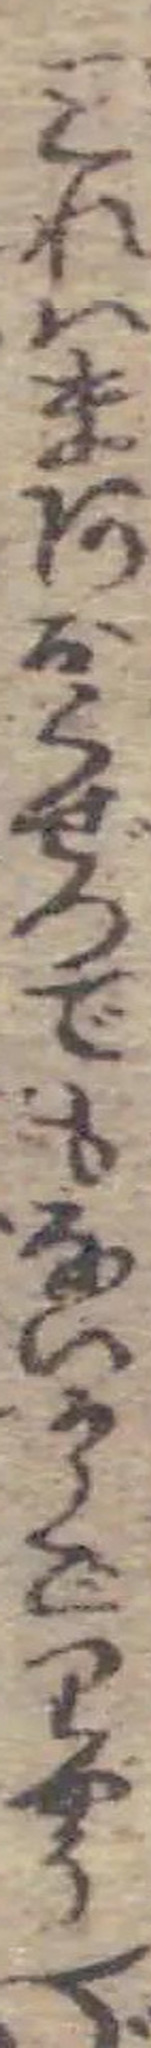〽これはまあおくぜつでもないからごりやう
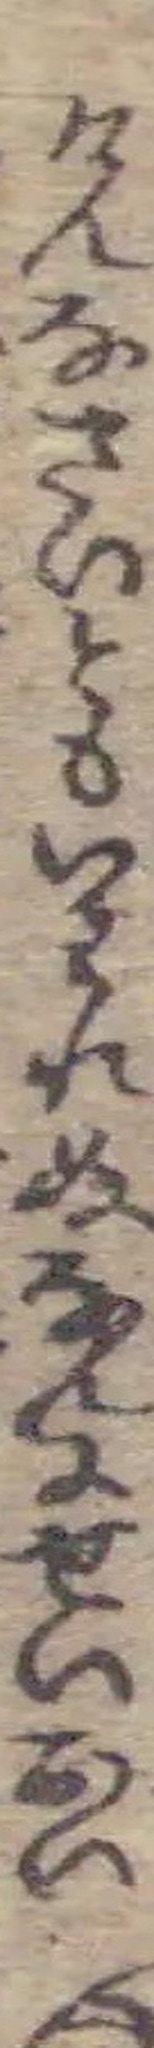けんなさいともいわれぬなんにせいおい
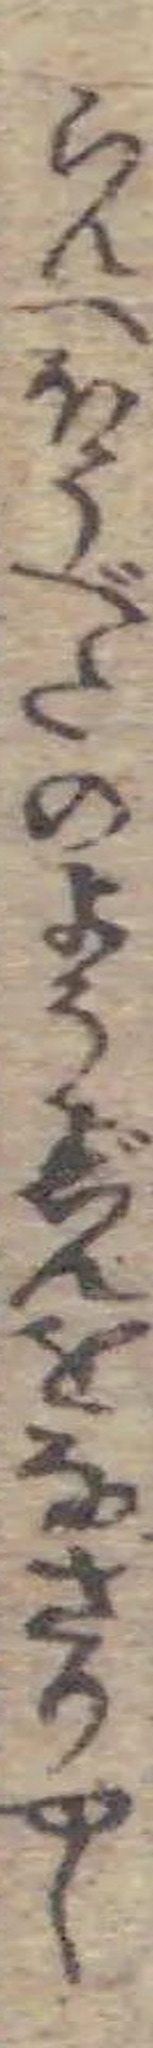らんへほうべこのようじんをなさりやし

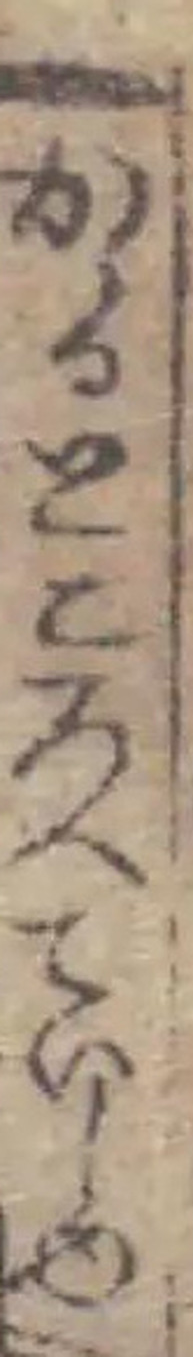かゝるところへていしゆ
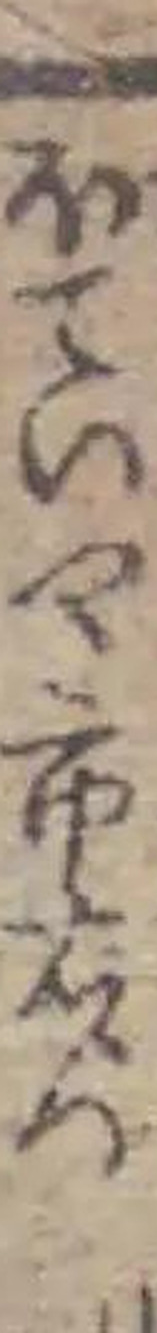ほていや市右衛門
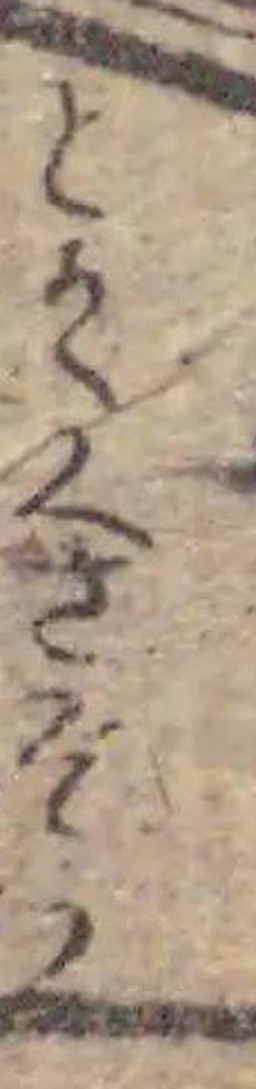とかくくへさぞう
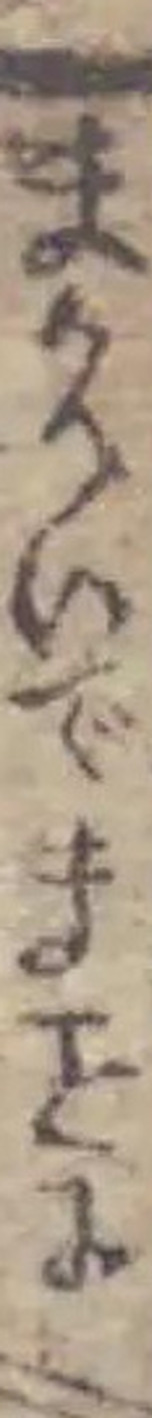まかりいでまことに
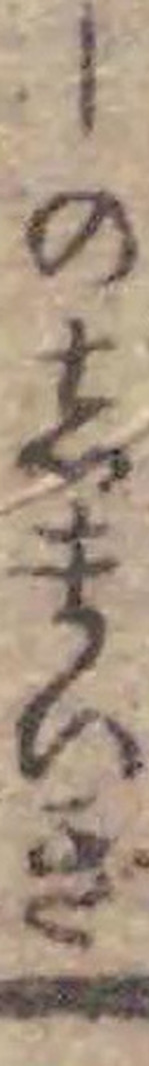しのしまいぎ
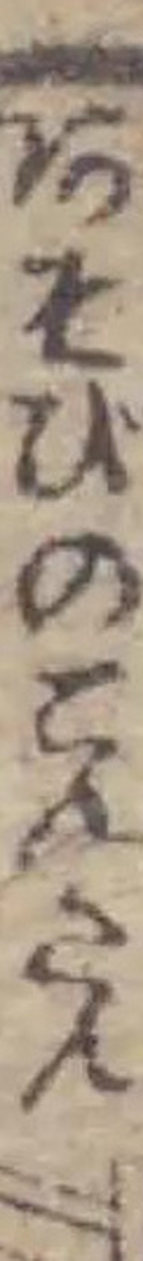あそびのこんたん
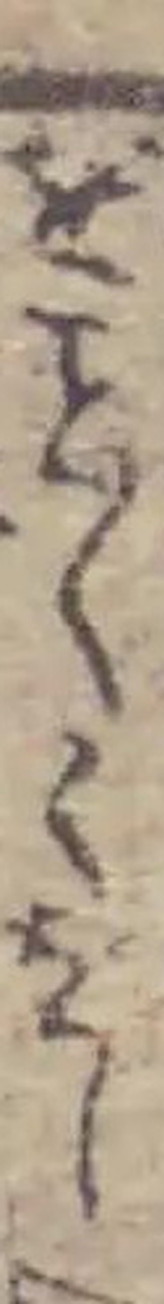をこと〳〵くをし
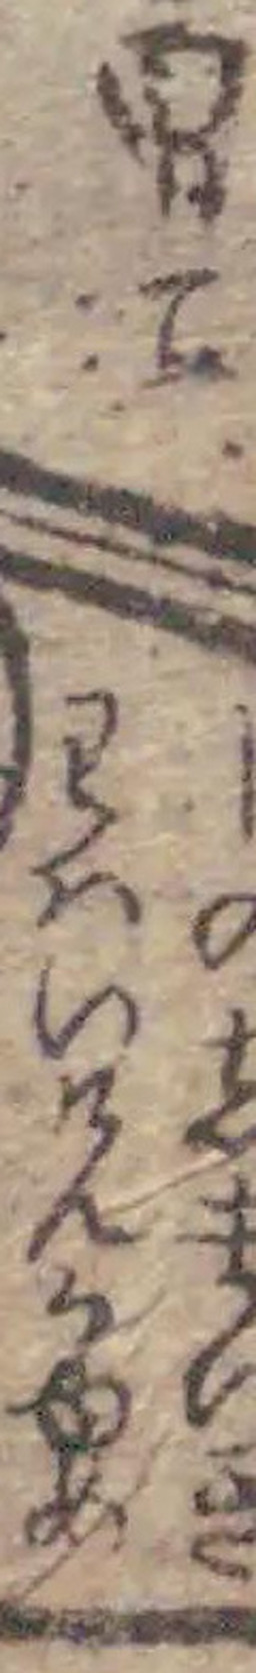わはいけんかゆめ
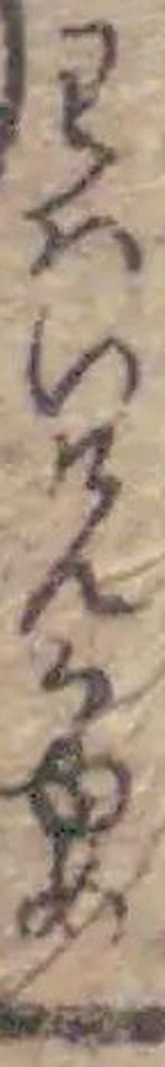わはいけんかゆめ
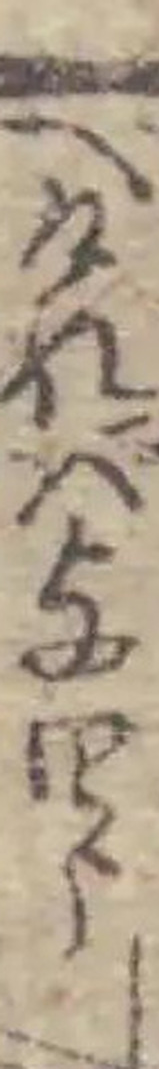へければ与四郎
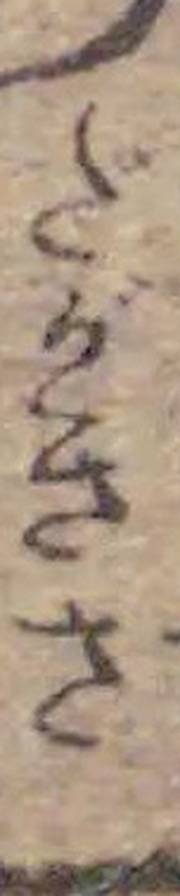だがきさ
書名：色男其処此処 3巻
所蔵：国立国会図書館 National Diet Library, JAPAN
